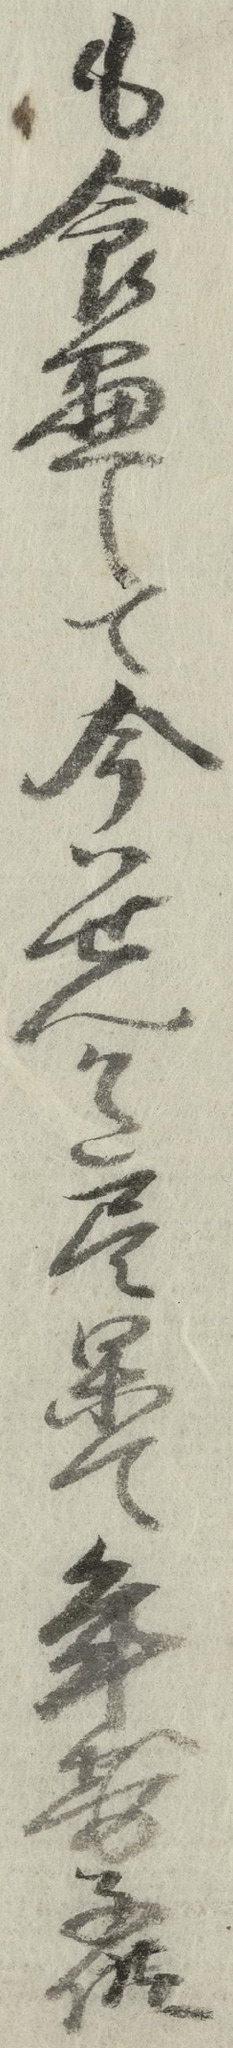も食べして今はせんかた尽果て年寄子供
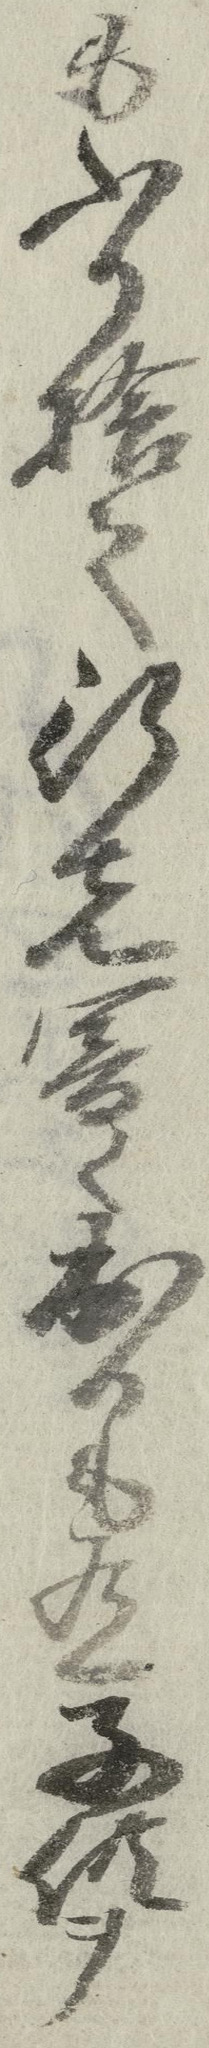もふり捨て行先闇く出るも有子供ヲ
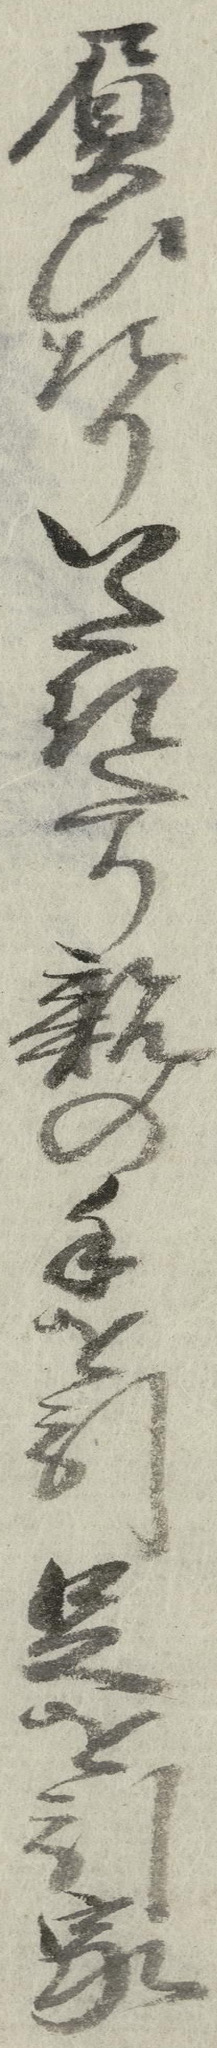負ひたりいたきたり親の手を引足を引家
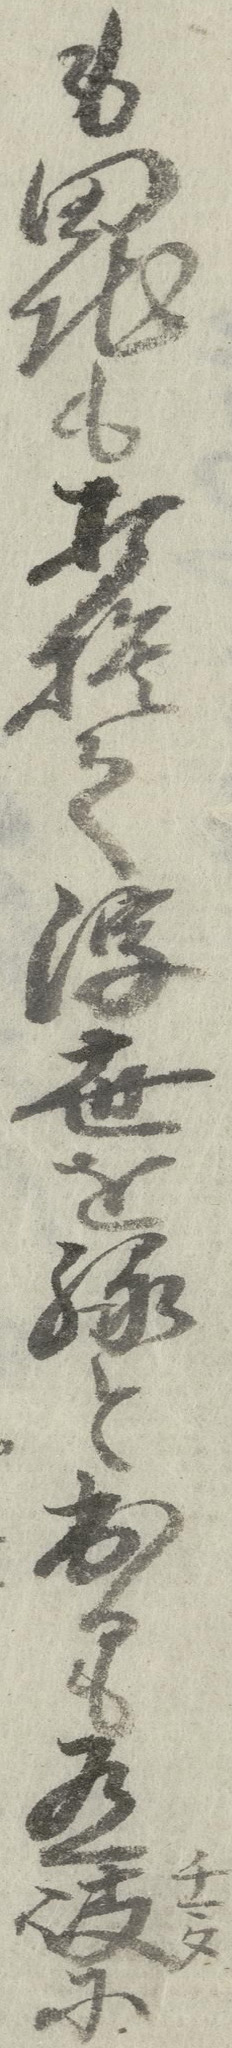も田地も打捨て浮世を縁と出るも有岐に
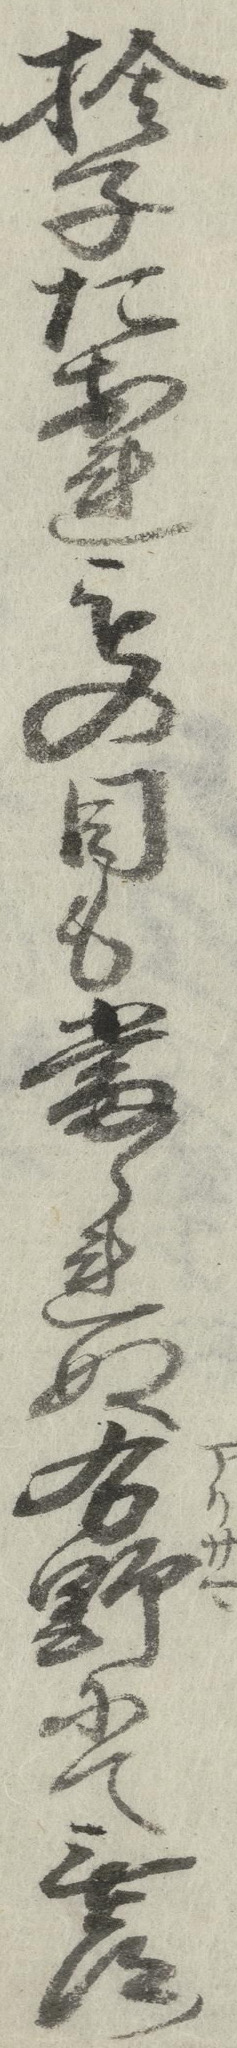捨子たおれもの目も当られぬ有野にて無道
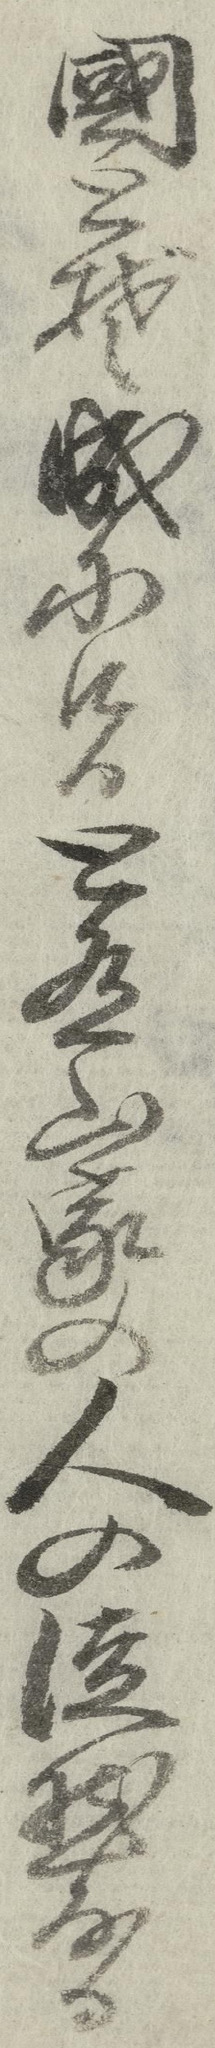国とぞ成にけると有山家の人の徒然なる
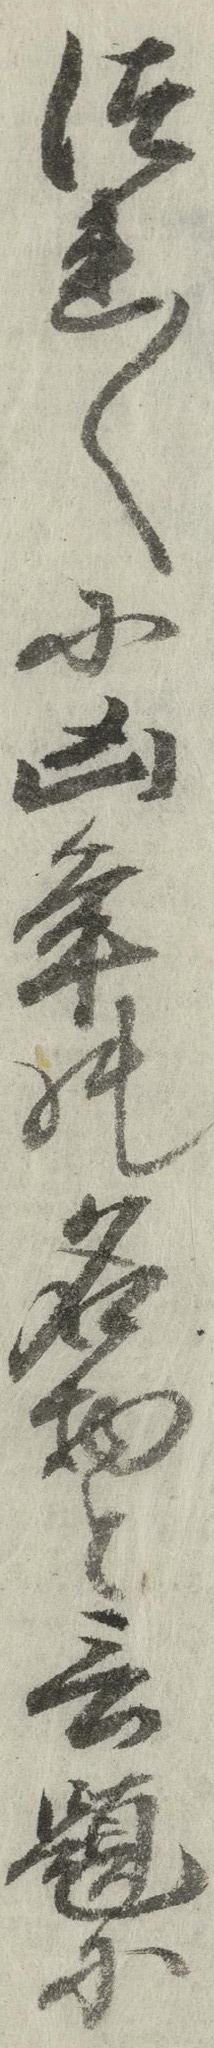つれ〳〵に凶年の名物と云題に

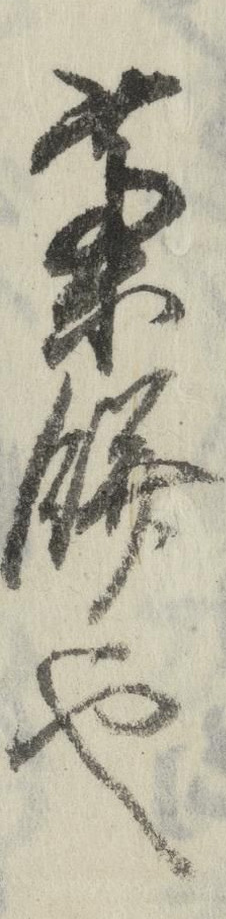藁餅や
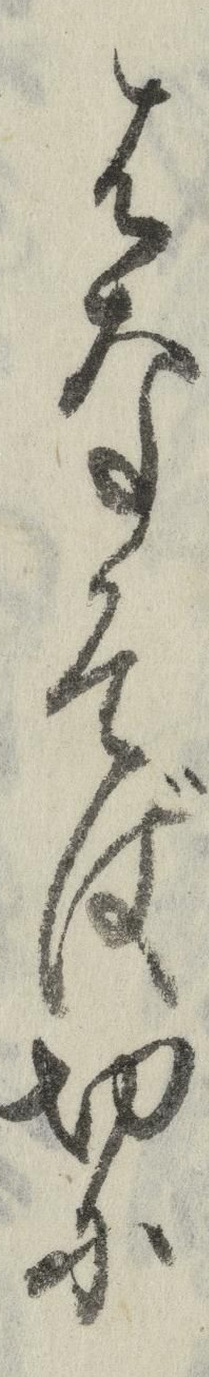はなそば切に
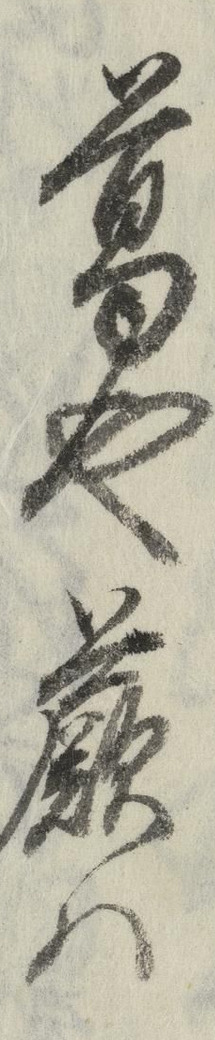葛や蕨は
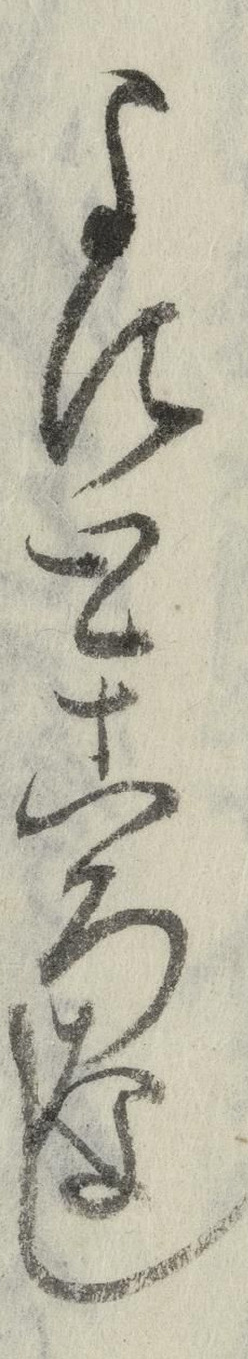よにところなし
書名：浅間大焼騒動記　上
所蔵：東京大学地震研究所図書室 Earthquake Research Institute Library, The University of Tokyo, JAPAN
